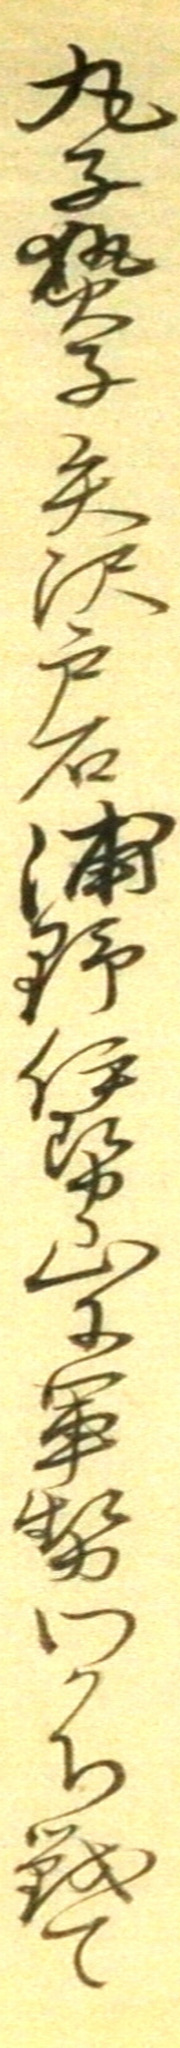丸子熱子矢沢戸石浦野伊勢山に軍勢わかち戦て
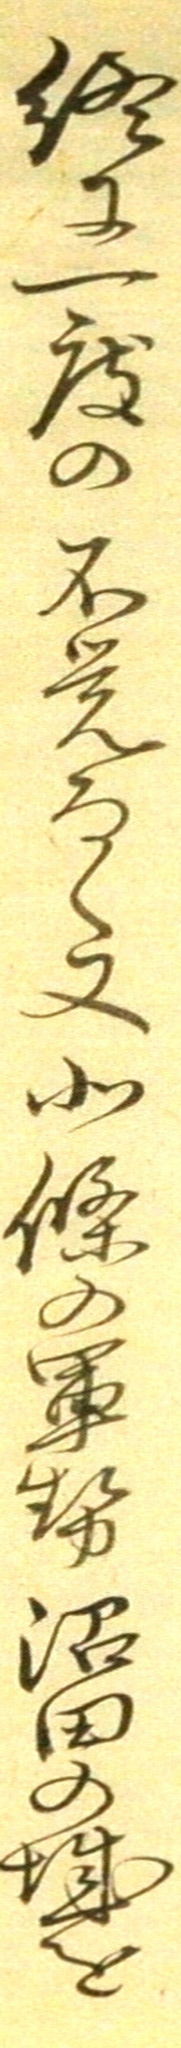終に一度の不覚なく又北条の軍勢沼田の城を
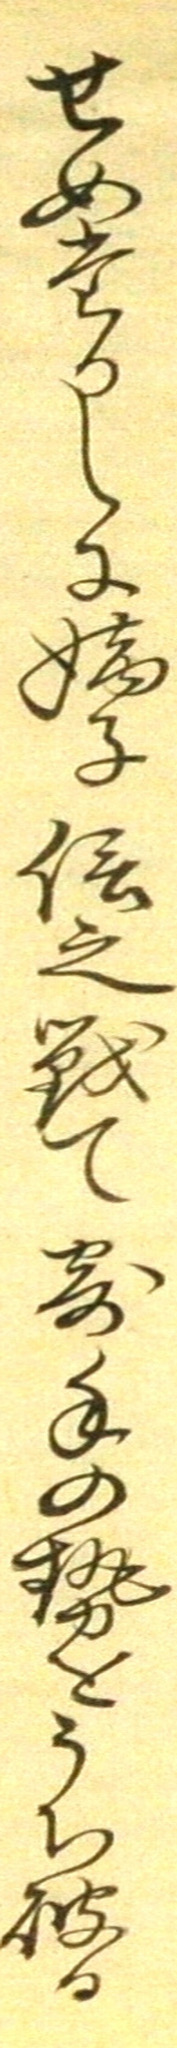せめたりしに嫡子信之戦て寄手の勢をうち破る
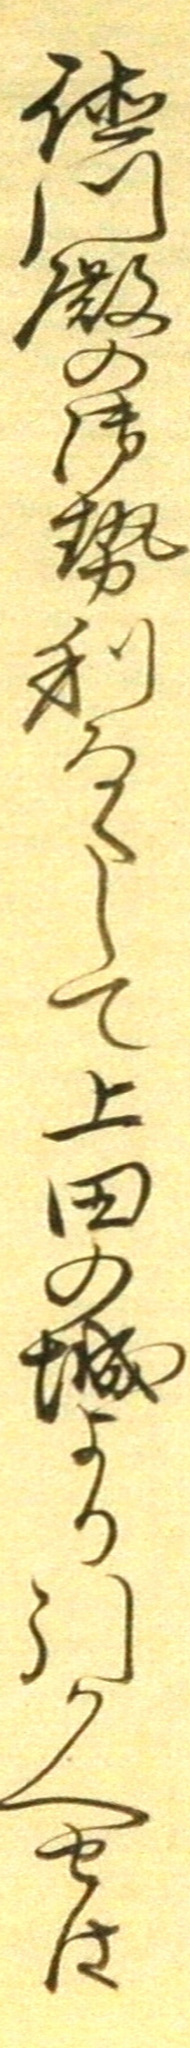徳川殿の御勢利なくして上田の城より引かへせは
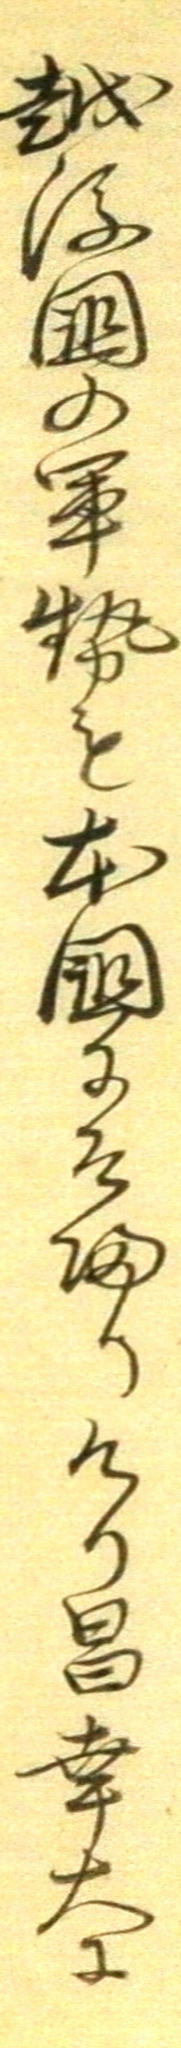越後国の軍勢も本国にそ帰りけり昌幸大に
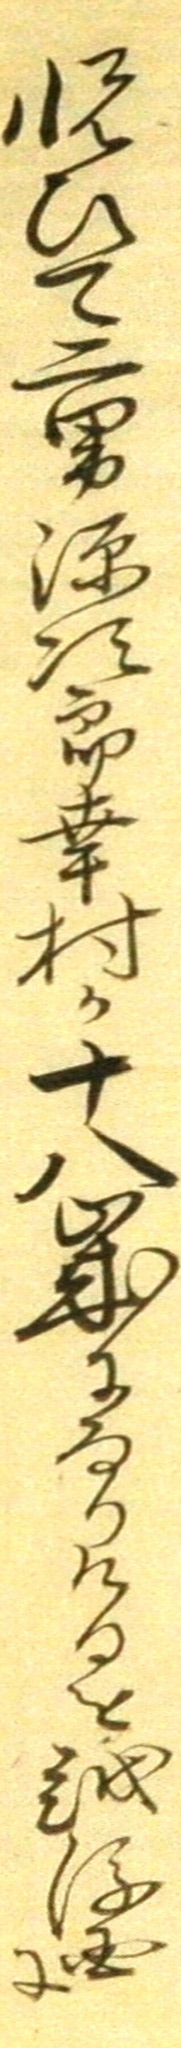悦ひて二男源次郎幸村か十八歳になりけるを越後国に
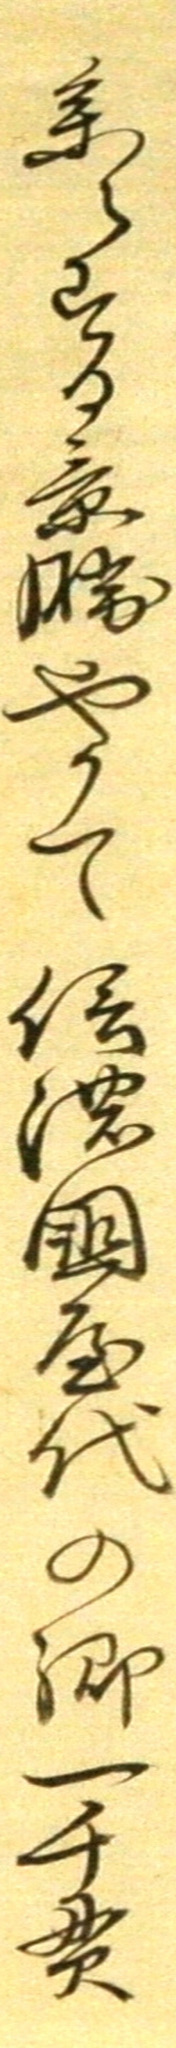参らする景勝やかて信濃国屋代の郷一千貫
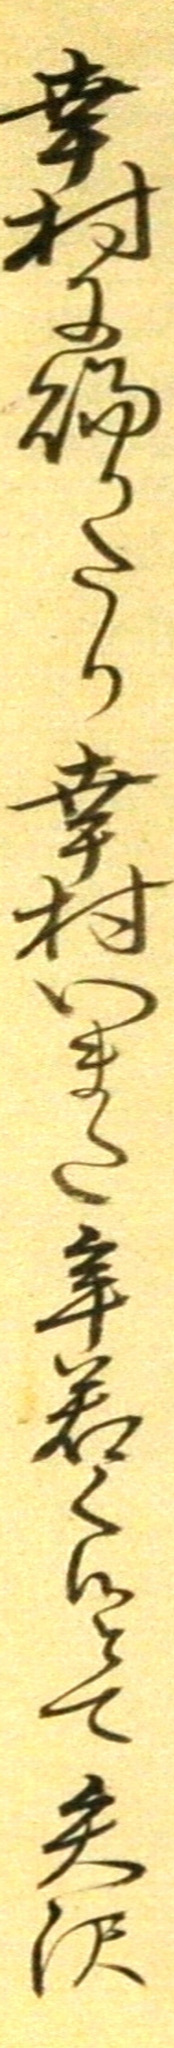幸村に賜りたり幸村いまた年若く候とて矢沢
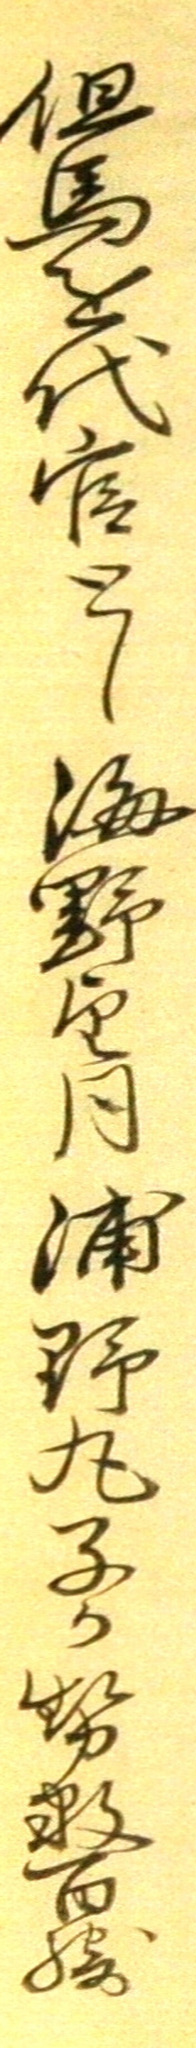但馬を代官とし海野望月浦野丸子か勢数百騎

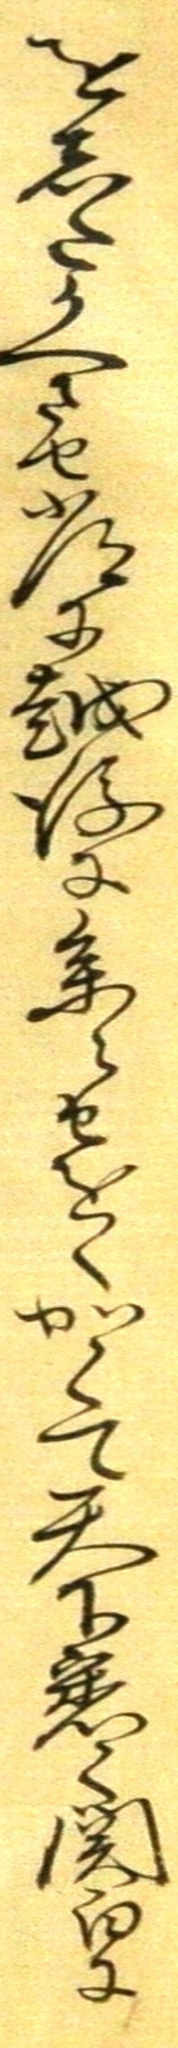をしたかへさせ常に越後に参らせをくかくて天下悉く関白に
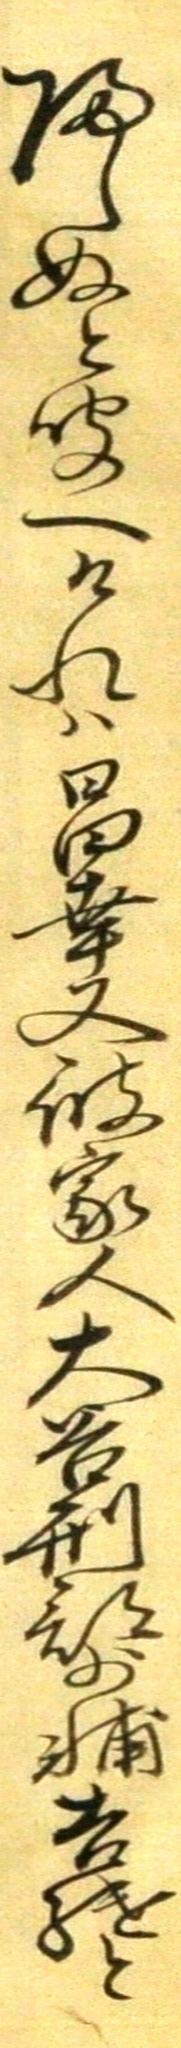帰しぬと聞へけれは昌幸又彼家人大谷刑部少輔吉継と
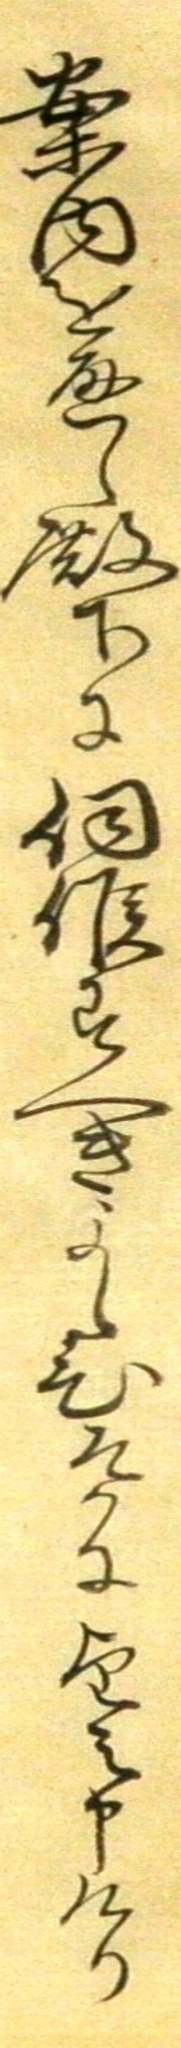案内を通し殿下に伺候すへきよしひそかに望み申けり
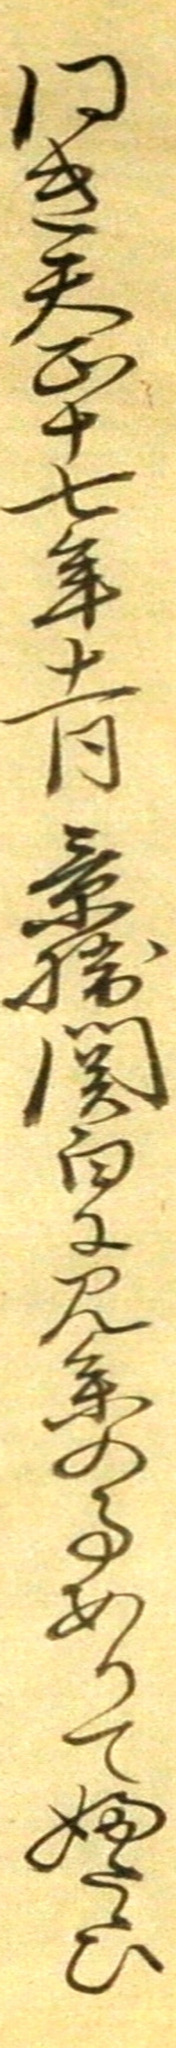同き天正十七年十一月景勝関白に見参の事ありてふたゝひ
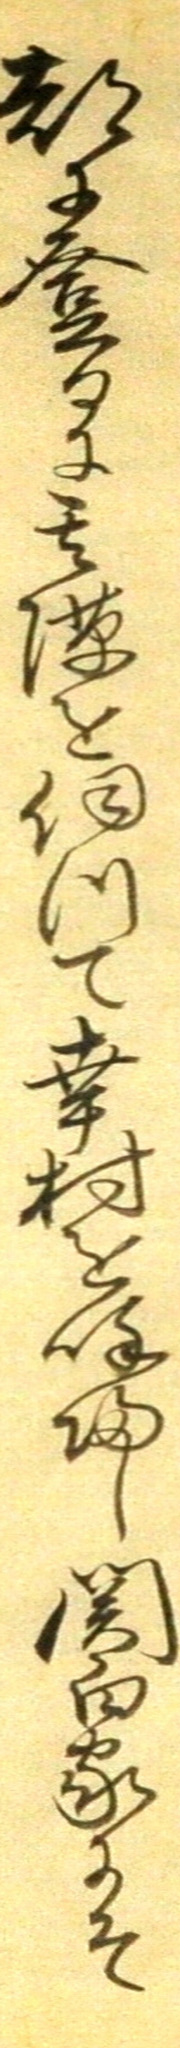都に登るに其隙を伺つて幸村を呼帰し関白家にそ
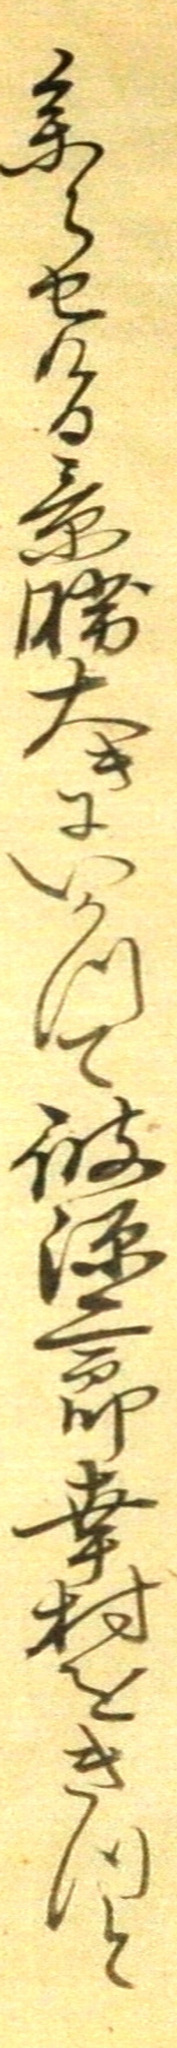参らせける景勝大きにいかつて彼源二郎幸村をきつと
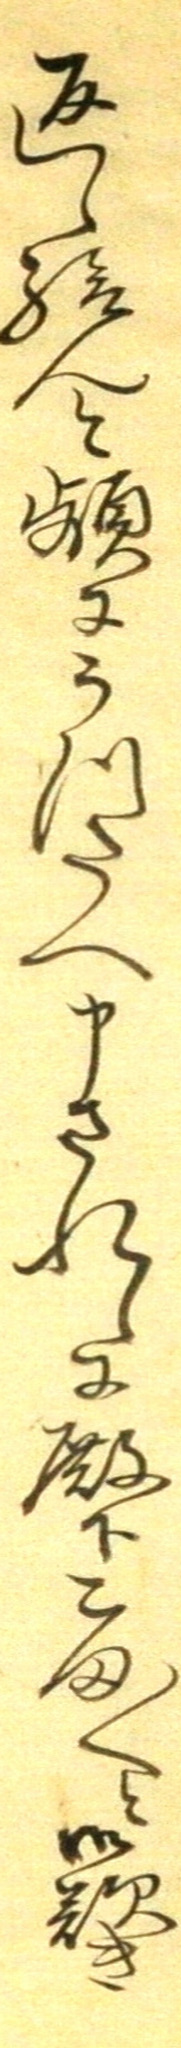返し給んと頻にうつたへ申されしに殿下こま〳〵と御嘆き
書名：藩翰譜（九・上）
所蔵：伊那市立高遠町図書館・合同会社AMANE
